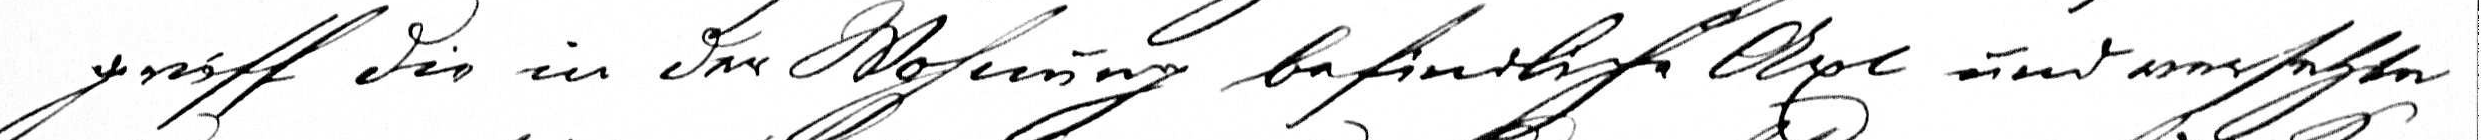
griff die in der Wohnung befindliche Axt und versetzte
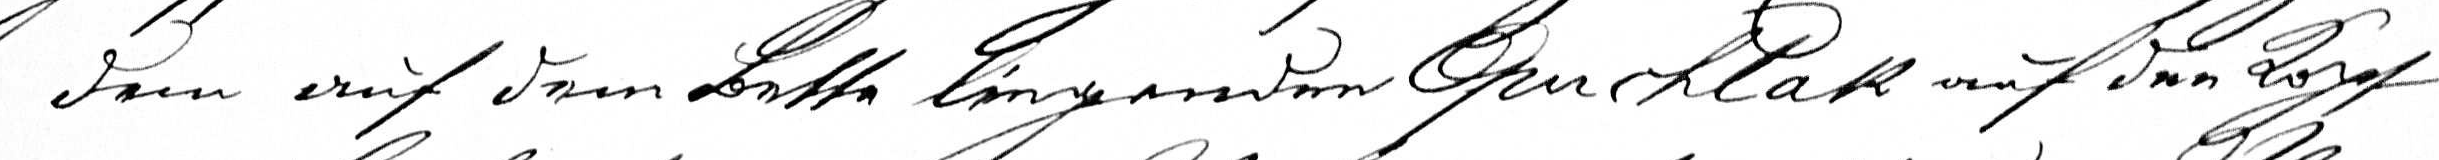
dem auf dem Bette liegenden Opuchlak auf den Kopf
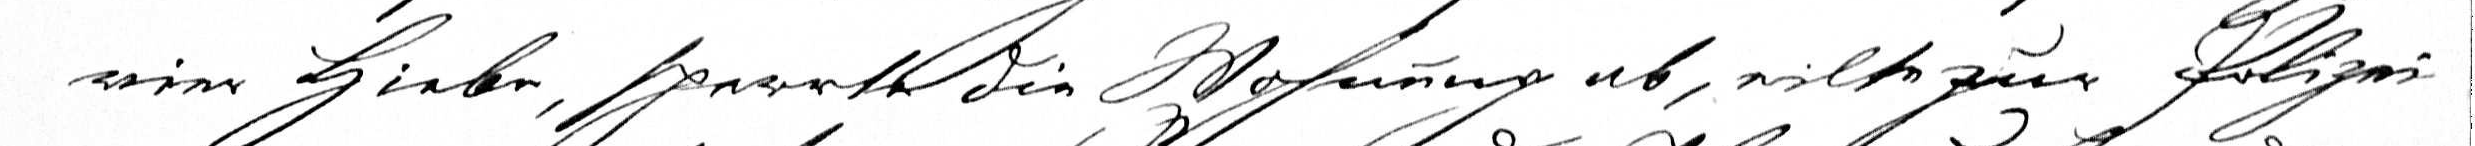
vier Hiebe, sperrte die Wohnung ab, eilte zur Polizei
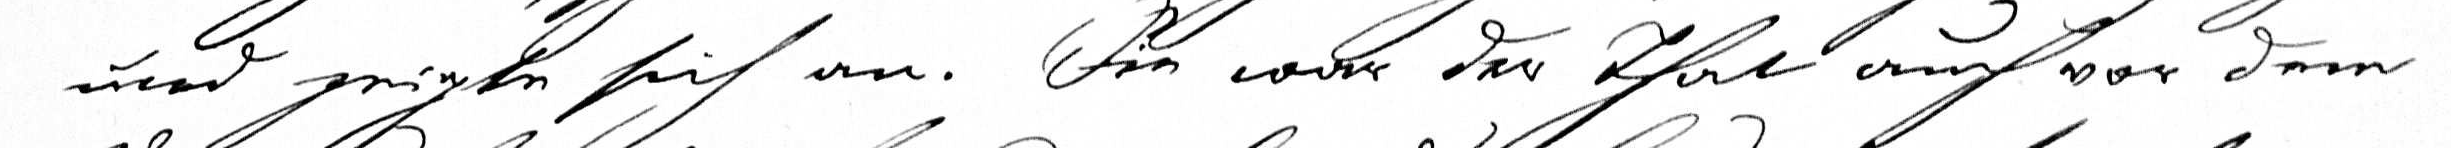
und zeigte sich an. Sie war der That auch vor dem
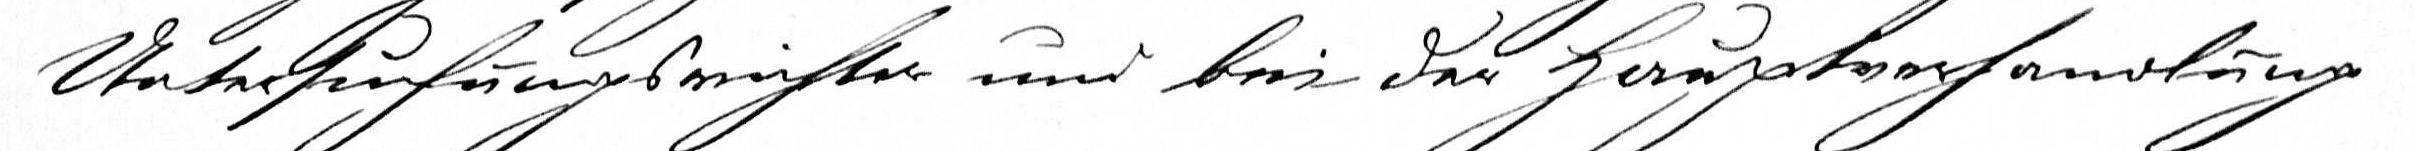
Untersuchungsrichter und bei der Hauptverhandlung
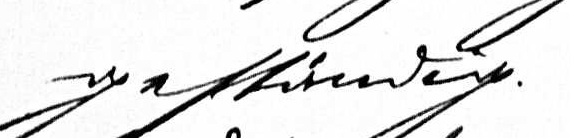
geständig.
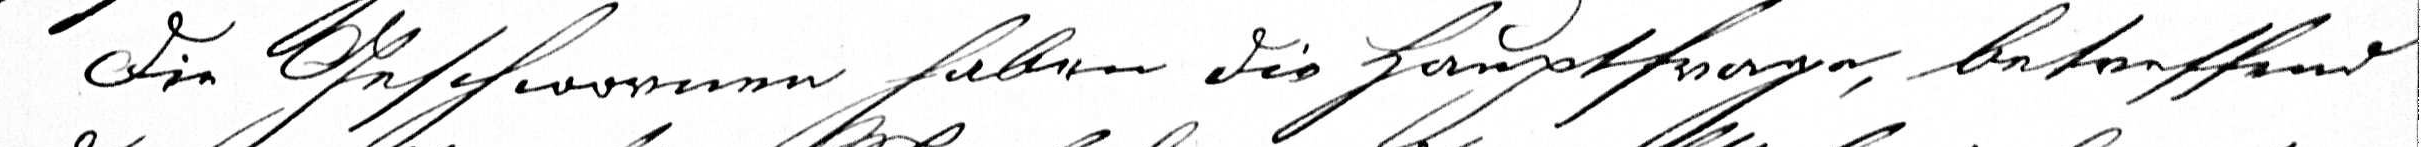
Die Geschworene haben die Hauptfrage, betreffend
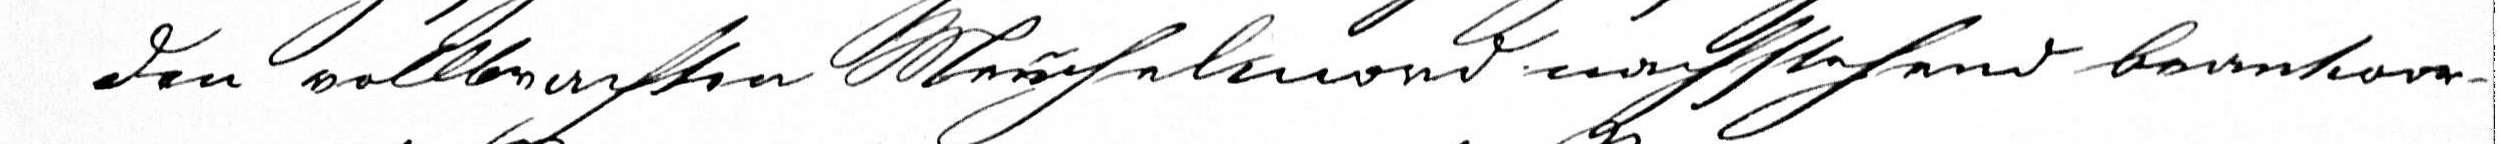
den vollbrachten Meuchelmord nachstehend beantwor¬
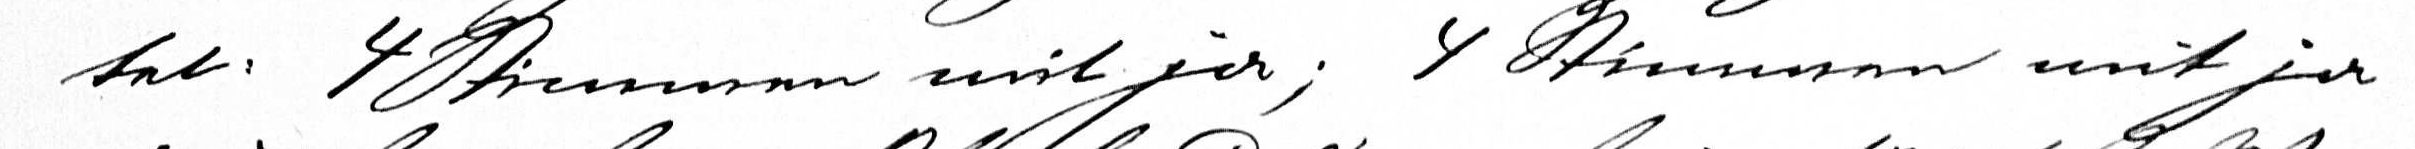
tet. 4 Stimmen mit ja; 4 Stimmen mit ja
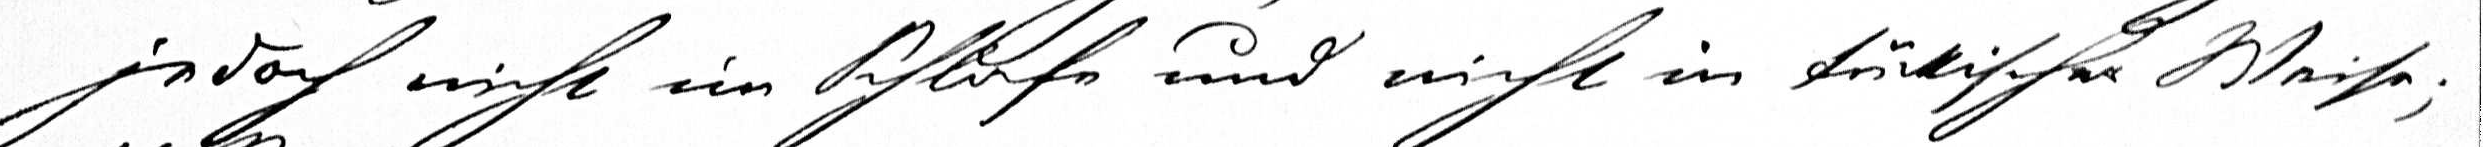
jedoch nicht im Schlafe und nicht in tückischer Weise;
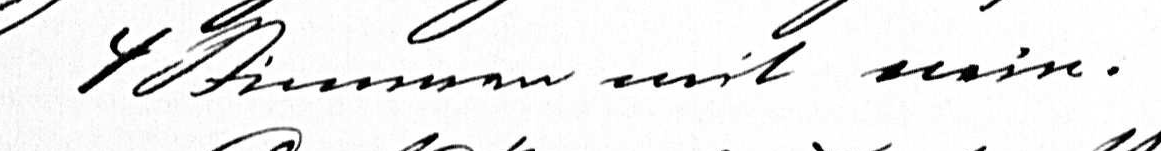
4 Stimmen mit nein.
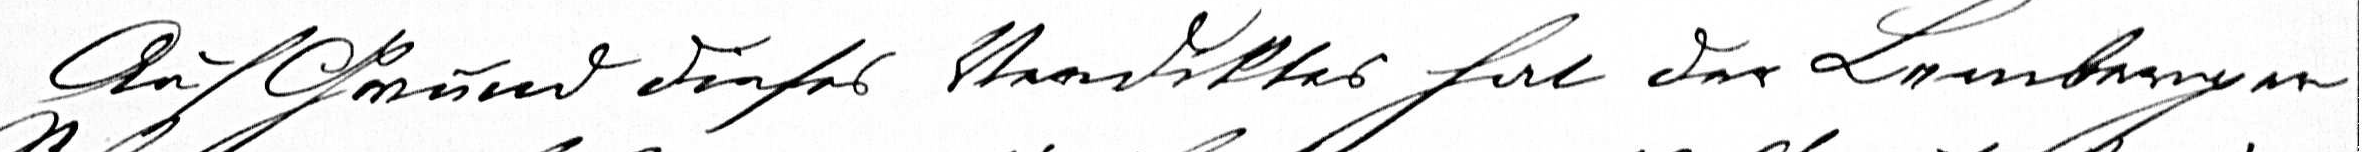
Auf Grund dieses Verdiktes hat der Lemberger
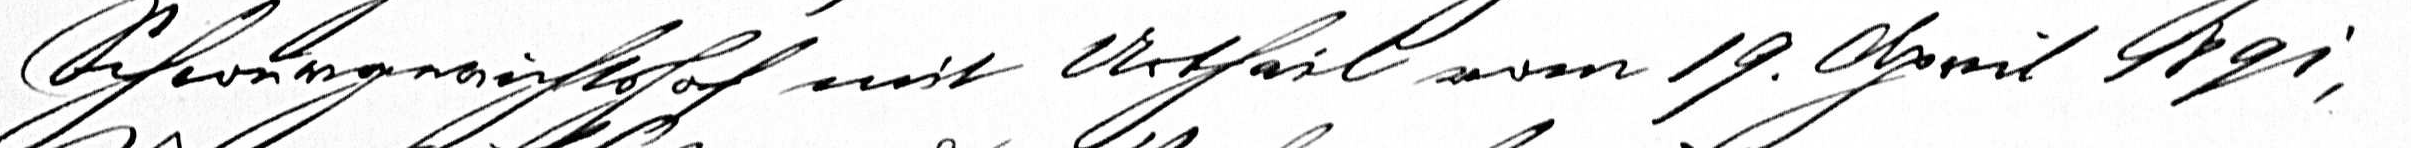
Schwurgerichtshof mit Urtheil vom 19. April 1891,
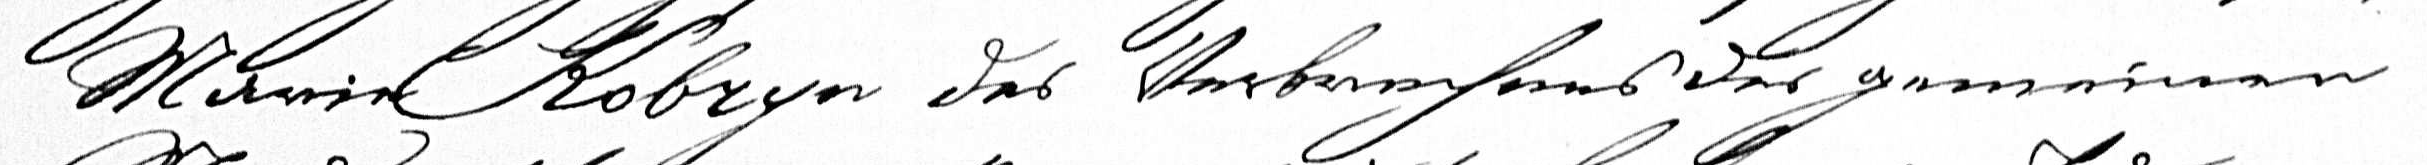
Marie Kobryn des Verbrechens der gemeinen
